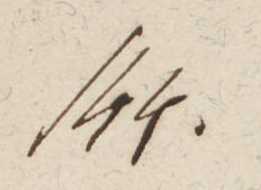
144.
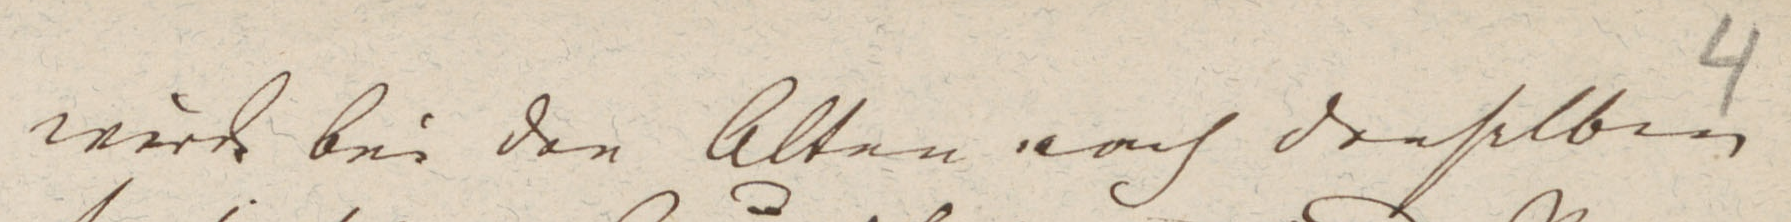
wurde bei den Alten nach denselben
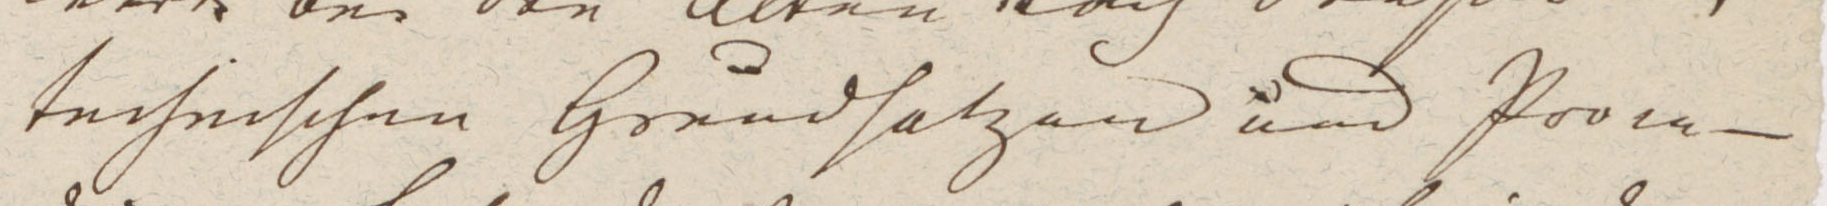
technischen Grundsatzen und Proce-
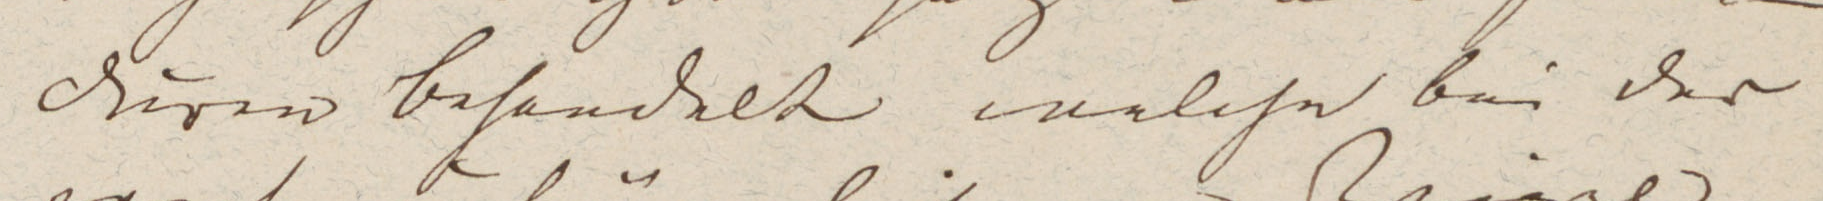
duren behandelt welche bei der
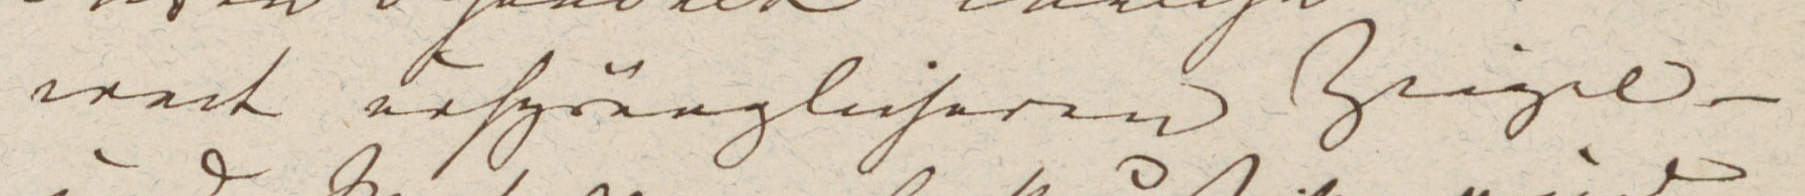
weit ursprünglicheren Ziegel-
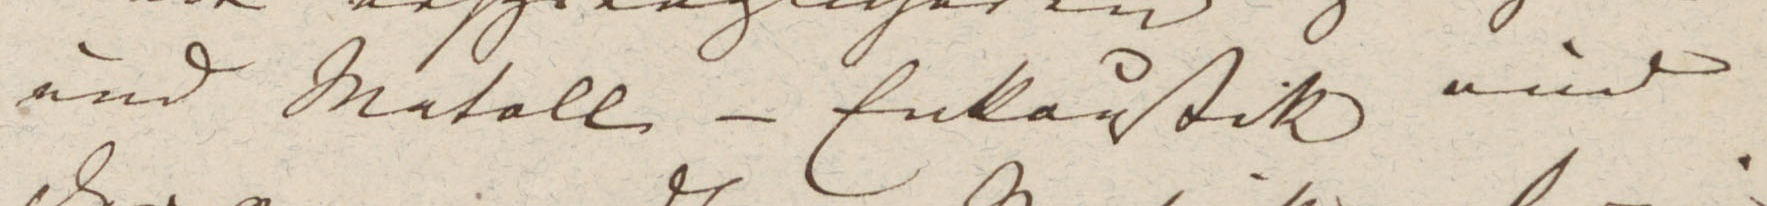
und Metall-Enkaustik und
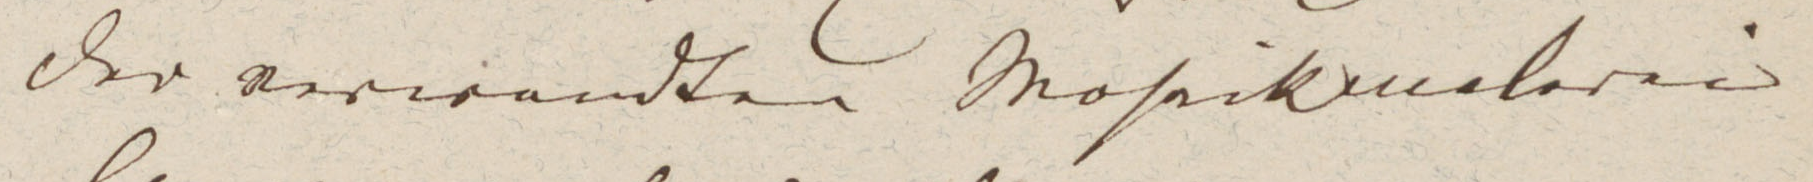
der verwandten Mosaikmalerei
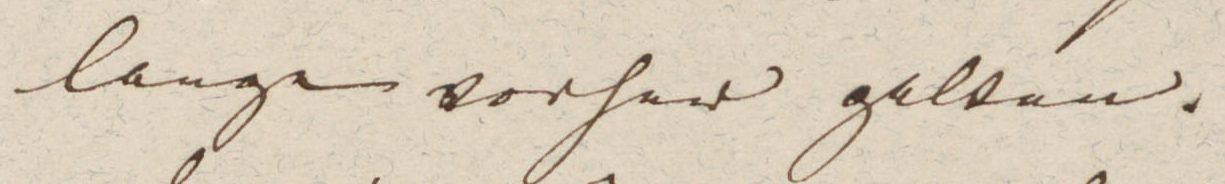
lange vorher gelten.
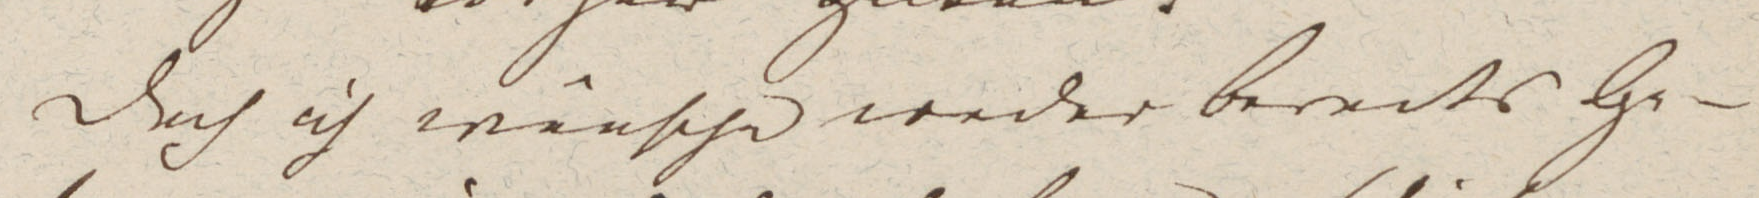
Doch ich wünsche weder bereits Ge-
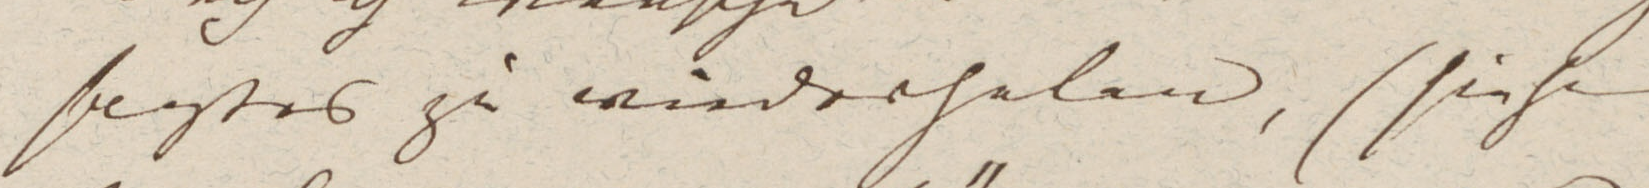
sagtes zu wiederholen, (siehe
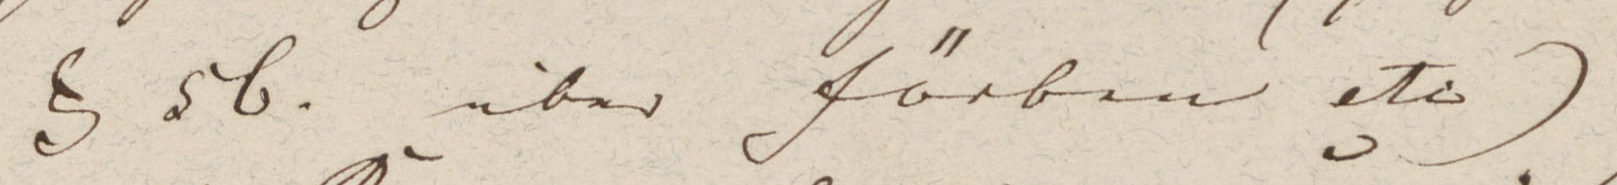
§ 56. über Färben etc)
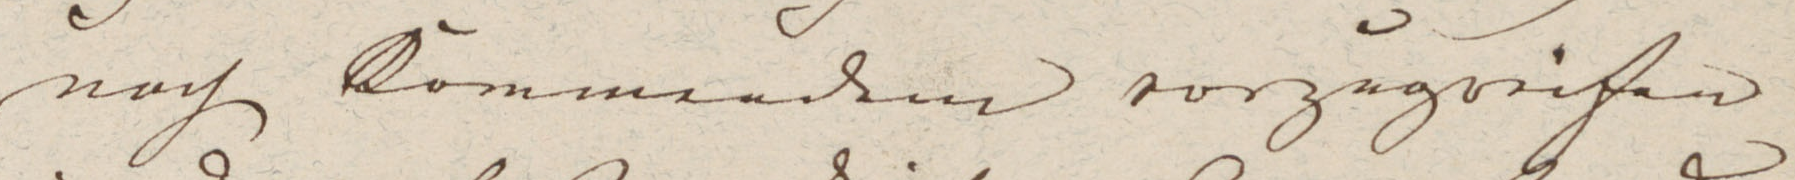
noch Kommendem vorzugreifen
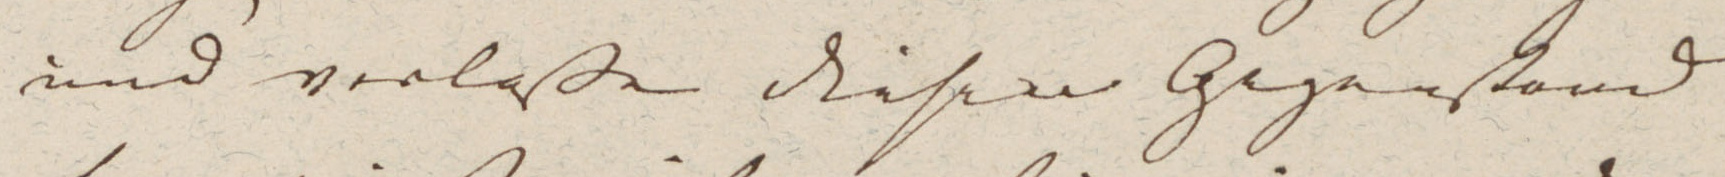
und verlasse diesen Gegenstand
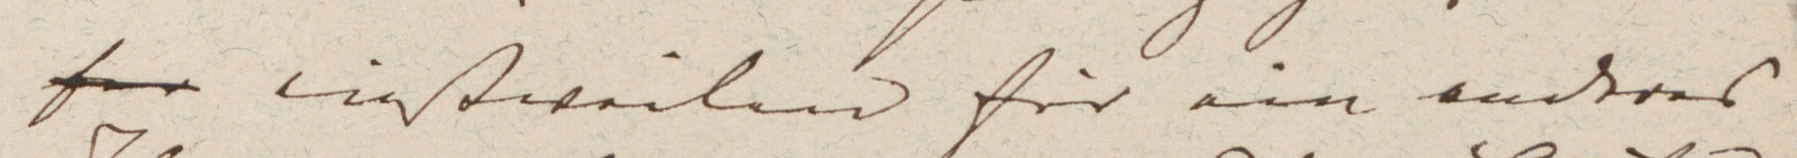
fur einstweilen für ein anderes
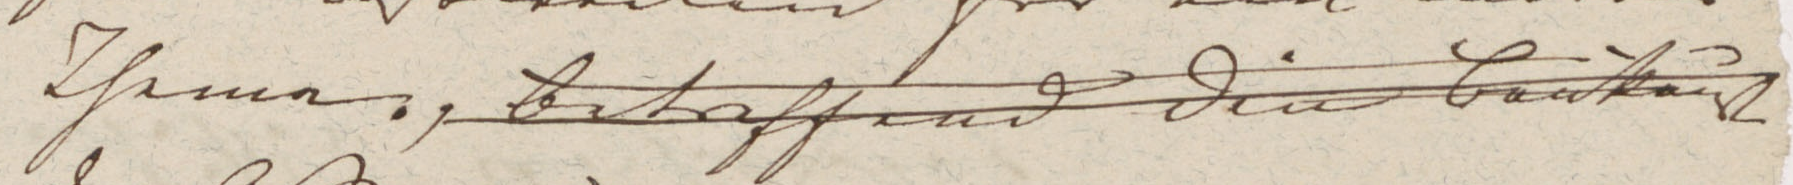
Thema., betreffend die Baukunst
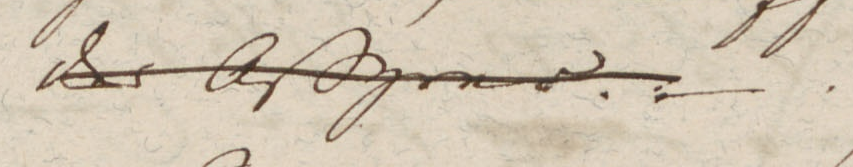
der Assyrer. – .
